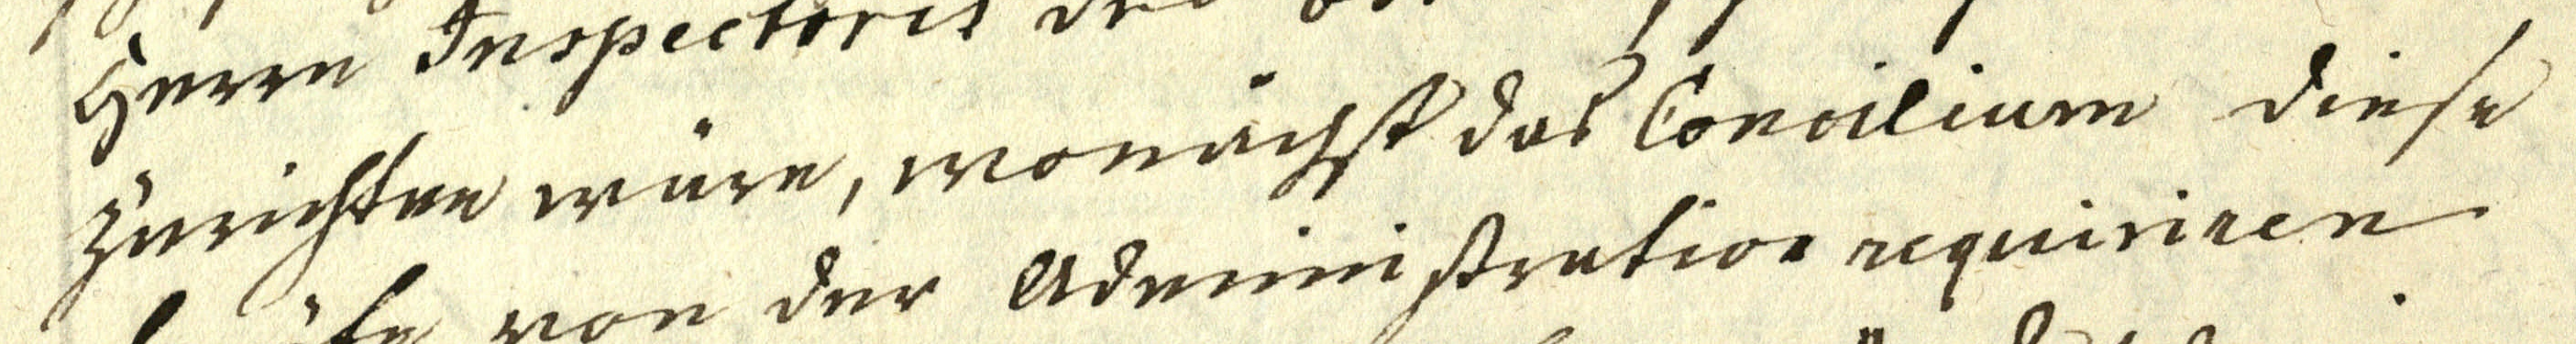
zurichten wäre, wonächst das Concilium diese
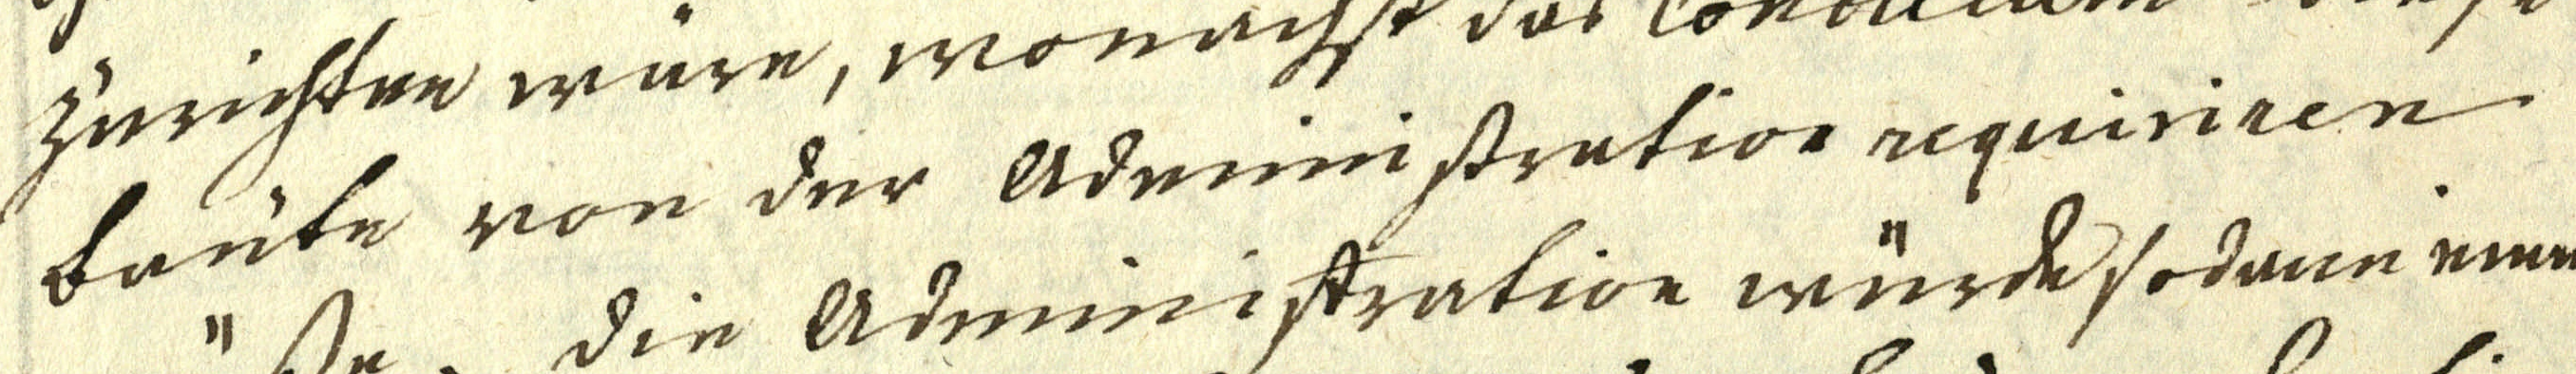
Baute von der Administration requiriren
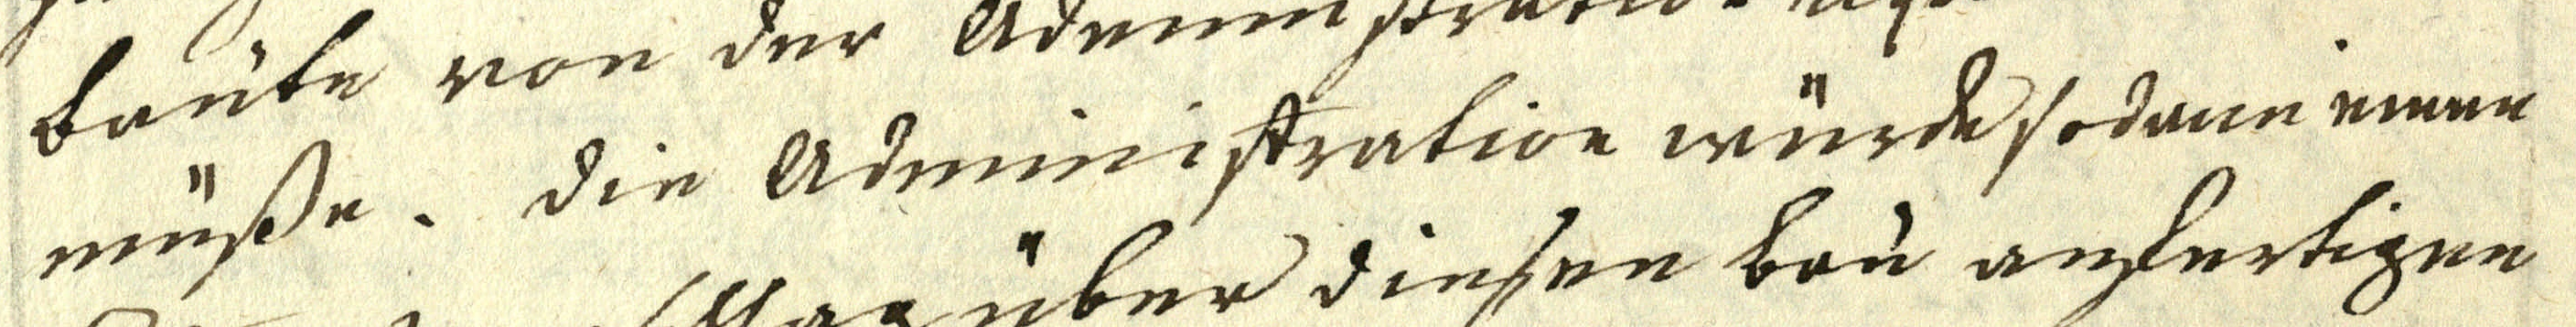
müße. Die Administration würde sodann einen
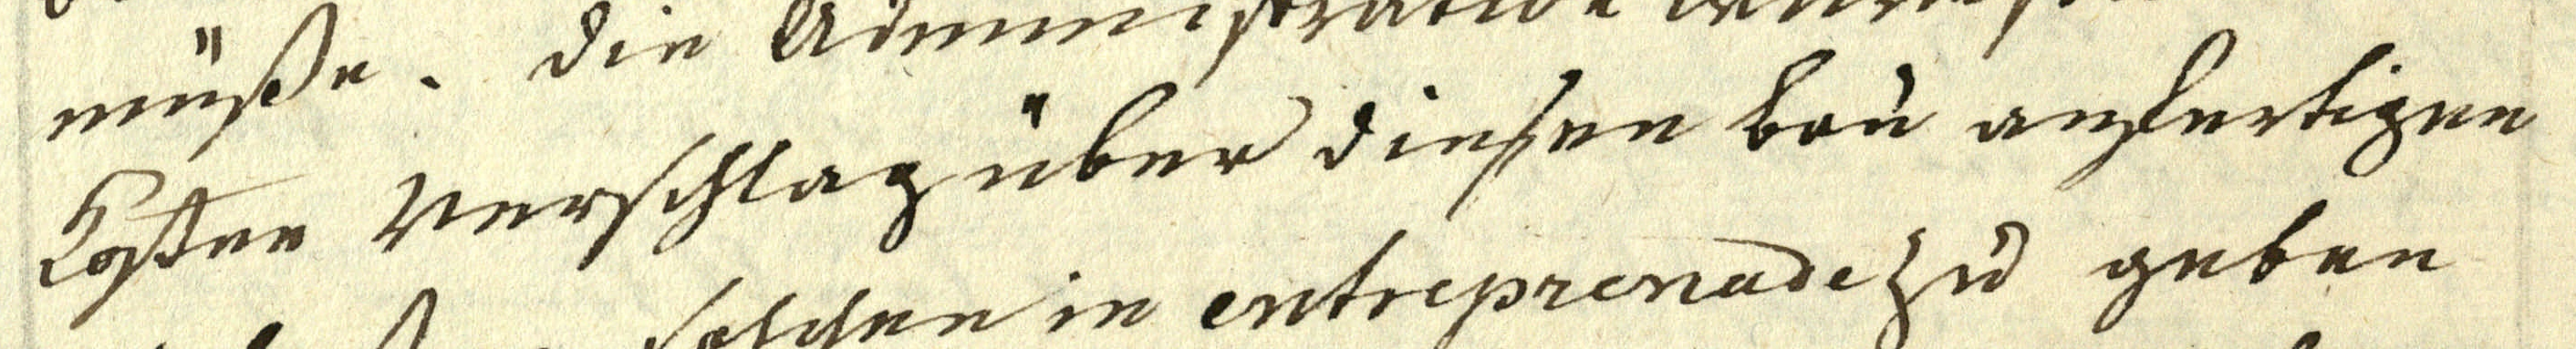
Kosten Verschlag über diesen Bau anfertigen
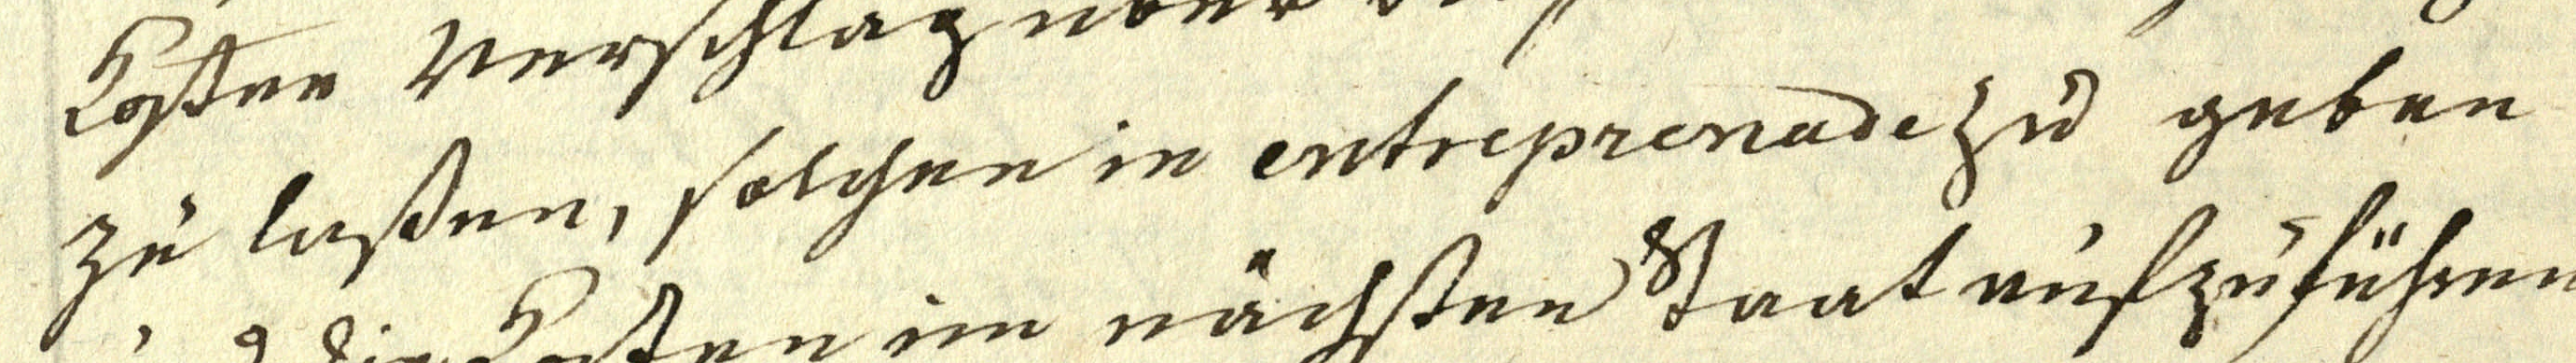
zu laßen, solchen in entreprenade zu geben
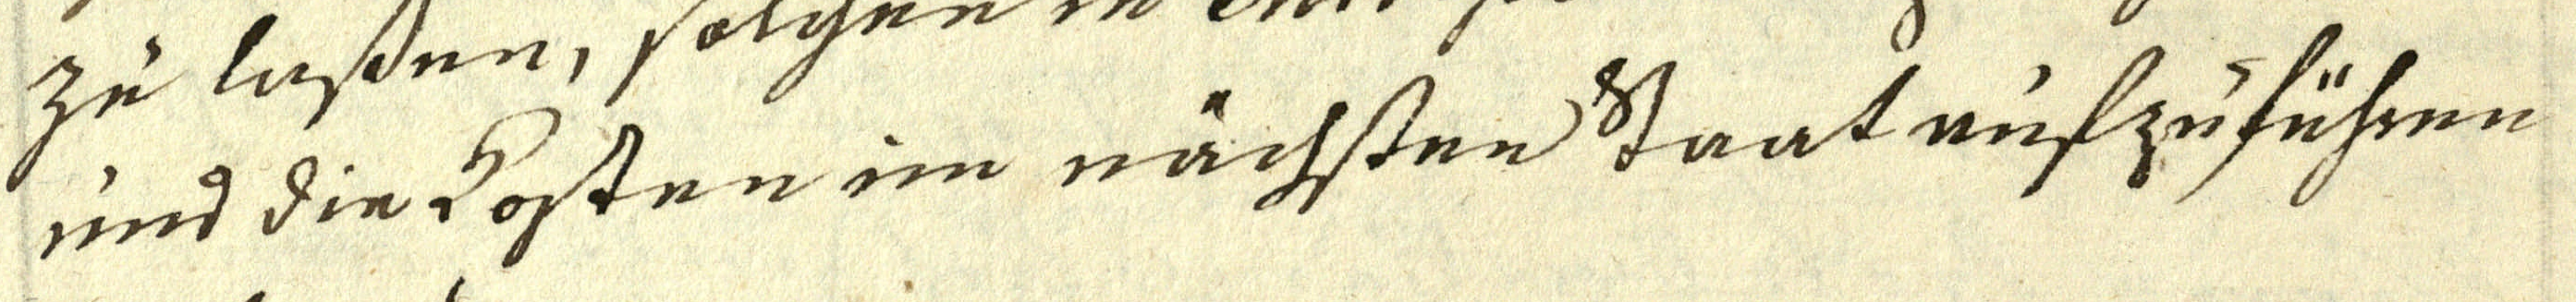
und die Kosten im nächsten Staat aufzuführen
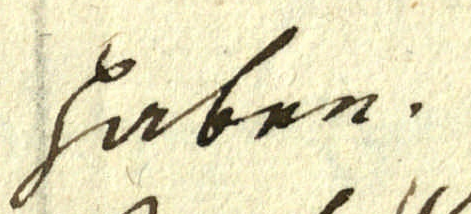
haben.
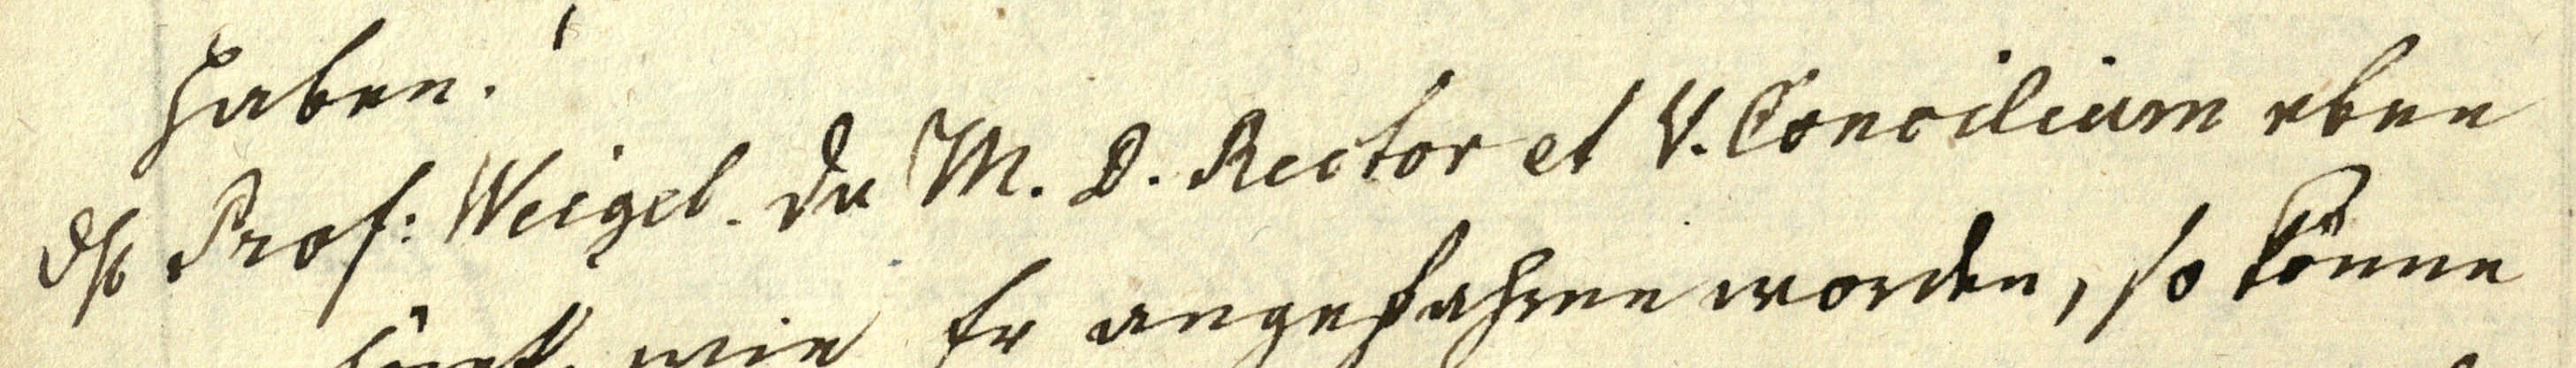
dh Prof. Weigel. Da M. D. Rector et V. Concilium eben
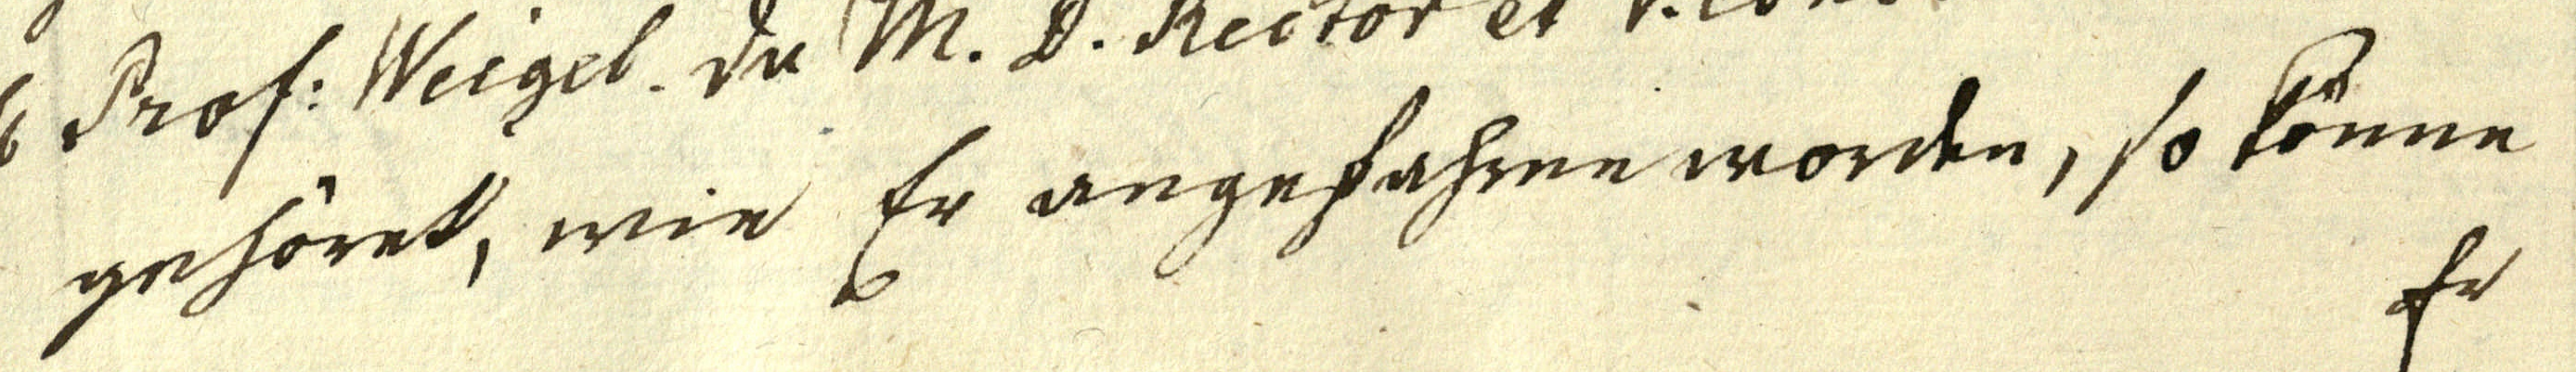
gehöret, wie Er angefahren worden, so könne
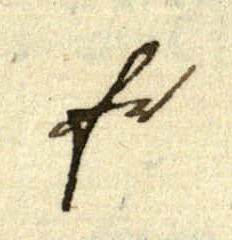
Er
